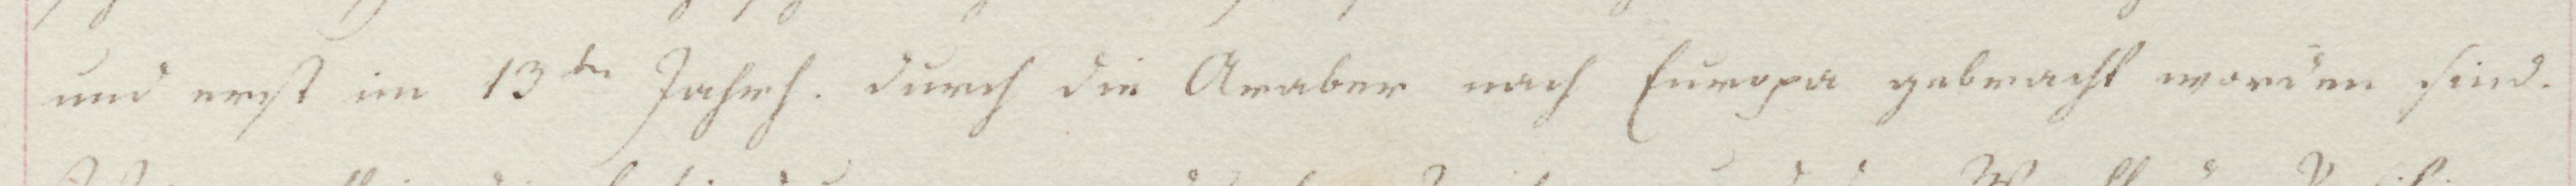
und erst im 13t￼ Jahrh. durch die Araber nach Europa gebracht worden sind.
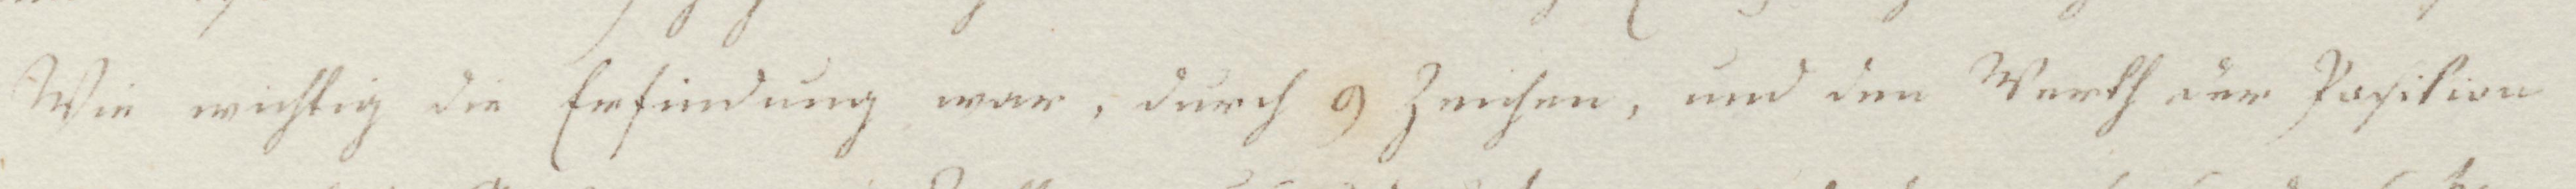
Wie wichtig die Erfindung war, durch 9 Zeichen, und den Werth der Position
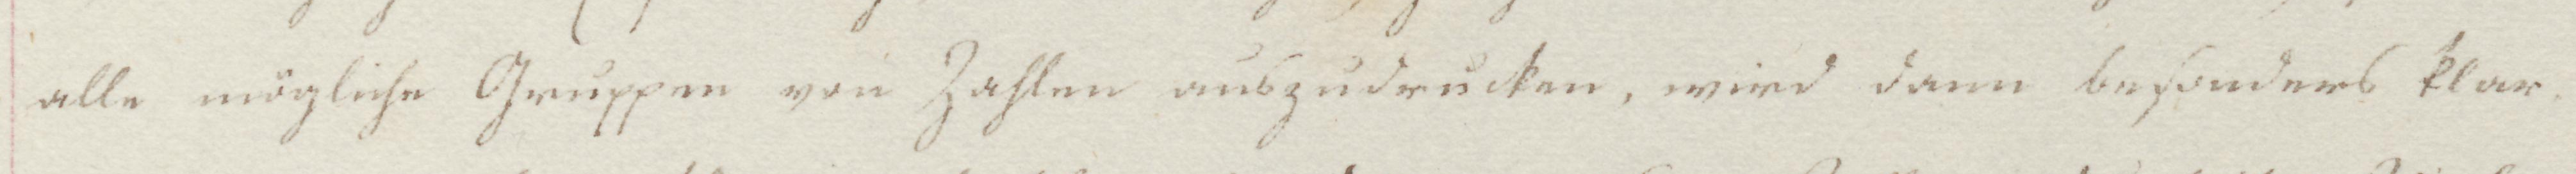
alle möglichen Gruppen von Zahlen auszudrucken, wird dann besonders klar,
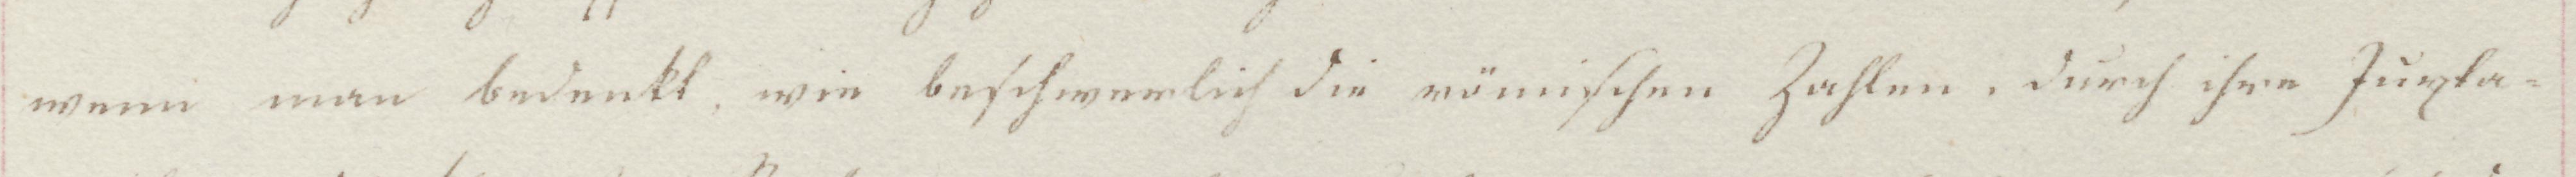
wenn man bedenkt, wie beschwerlich die römischen Zahlen, durch ihre Juxta-
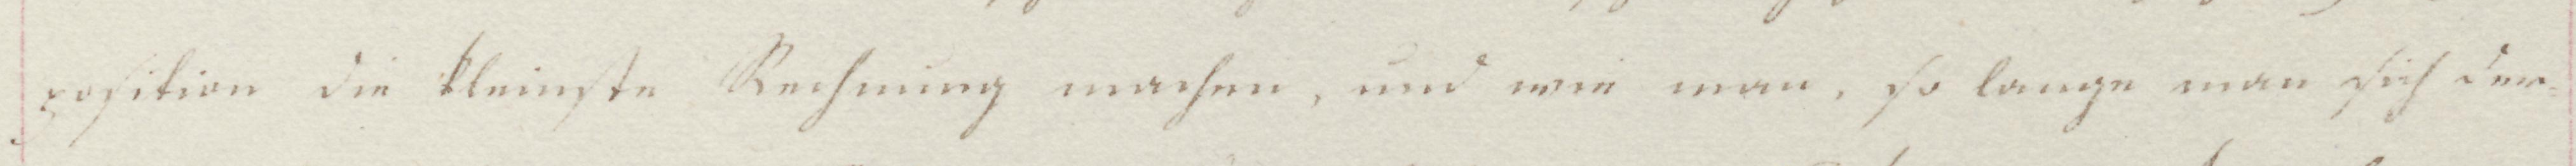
position die kleinste Rechnung machen, und wie man, so lange man sich der-
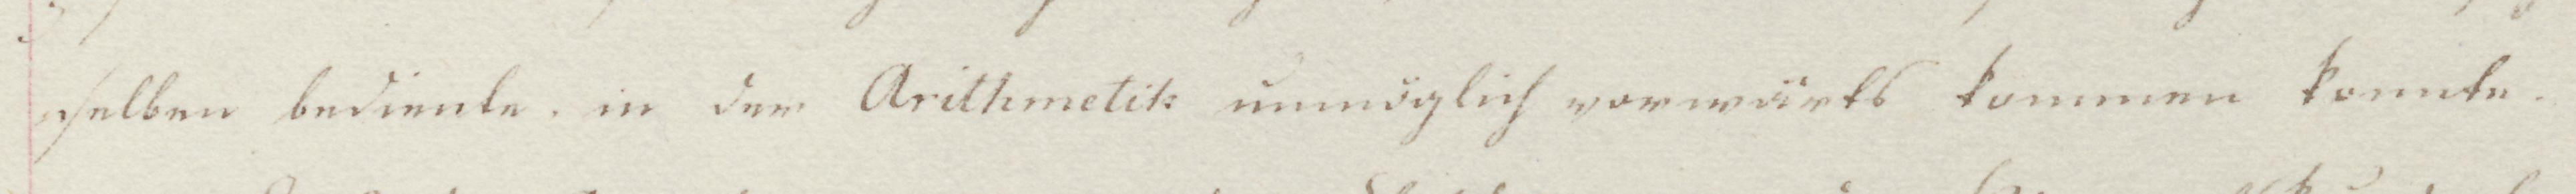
selben bediente, in der Arithmetik unmöglich vorwärts kommen konnte.
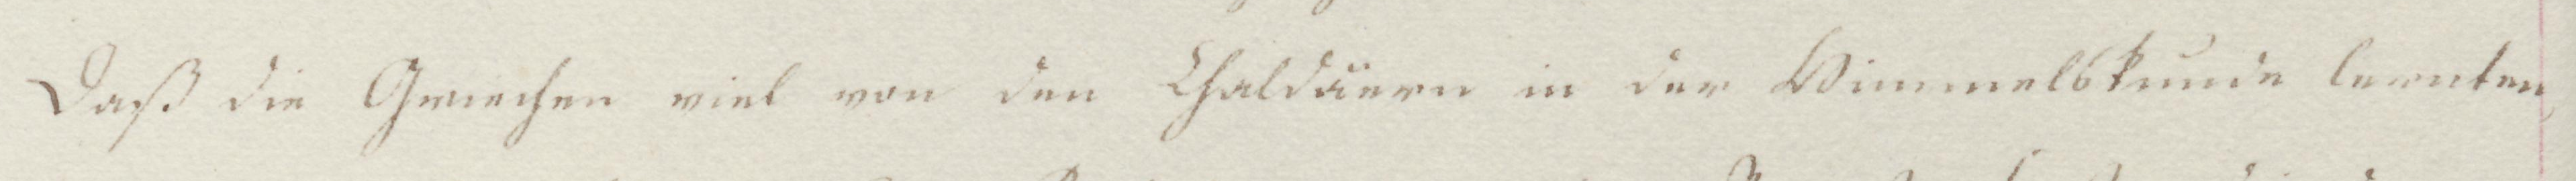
Daß die Griechen viel von den Chaldäern in der Himmelskunde lernten,
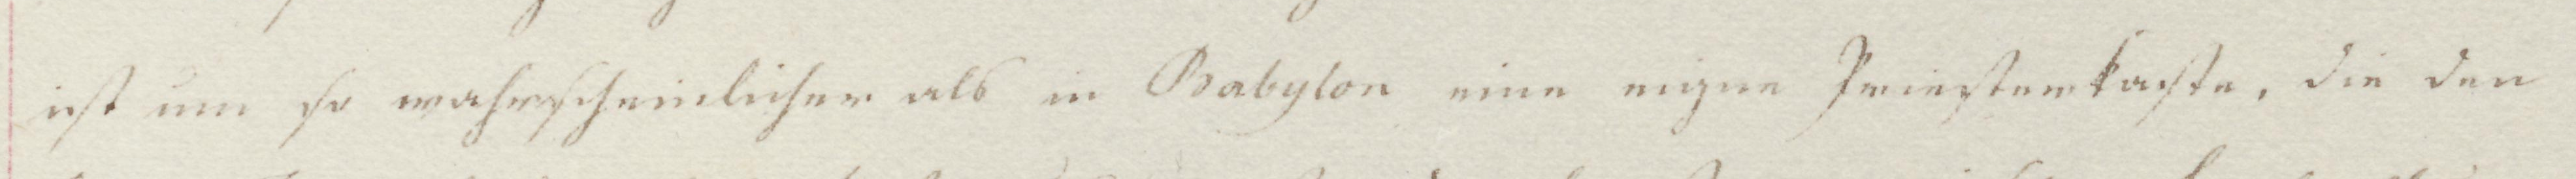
ist um so wahrscheinlicher als in Babylon eine eigne Priesterkaste, die den
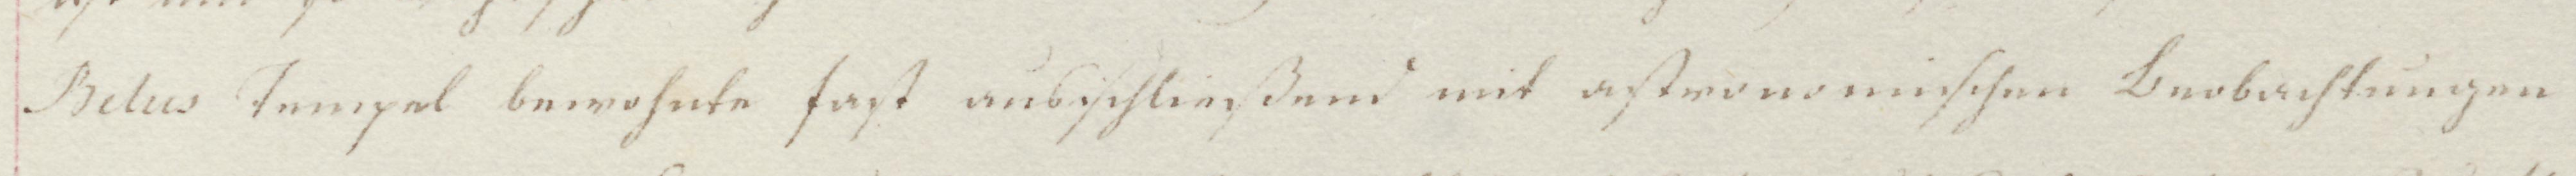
Belus Tempel bewohnte fast ausschließend mit astronomischen Beobachtungen
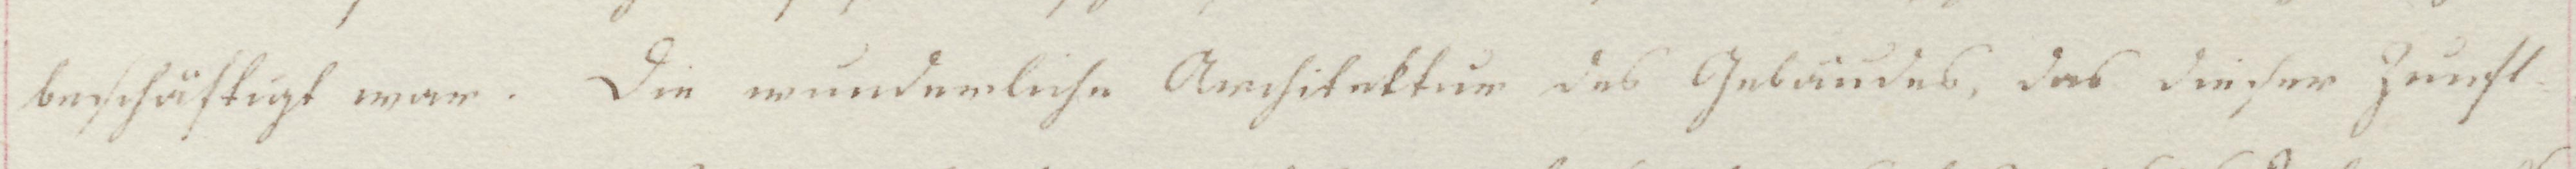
beschäftigt war. Die wunderliche Architektur des Gebäudes, das dieser Zunft-
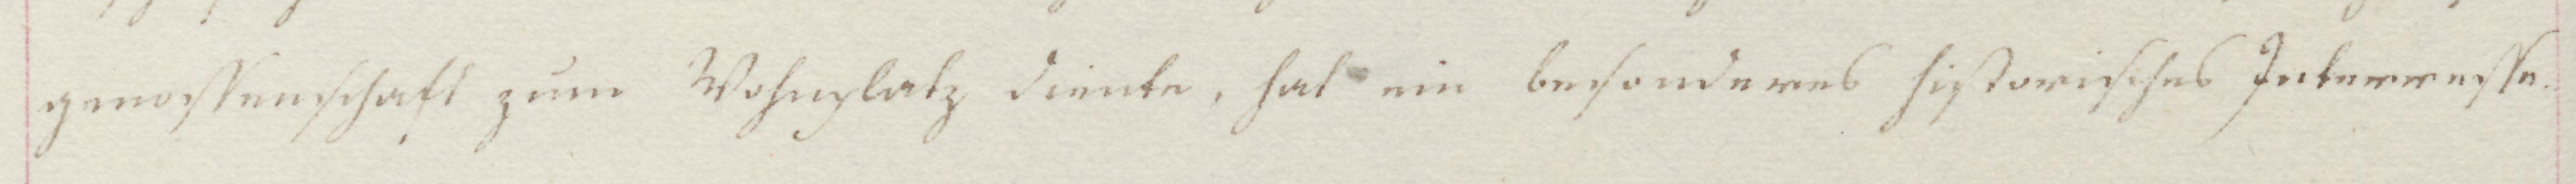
genossenschaft zum Wohnsitz diente, hat ein besonderes historisches Interresse.
